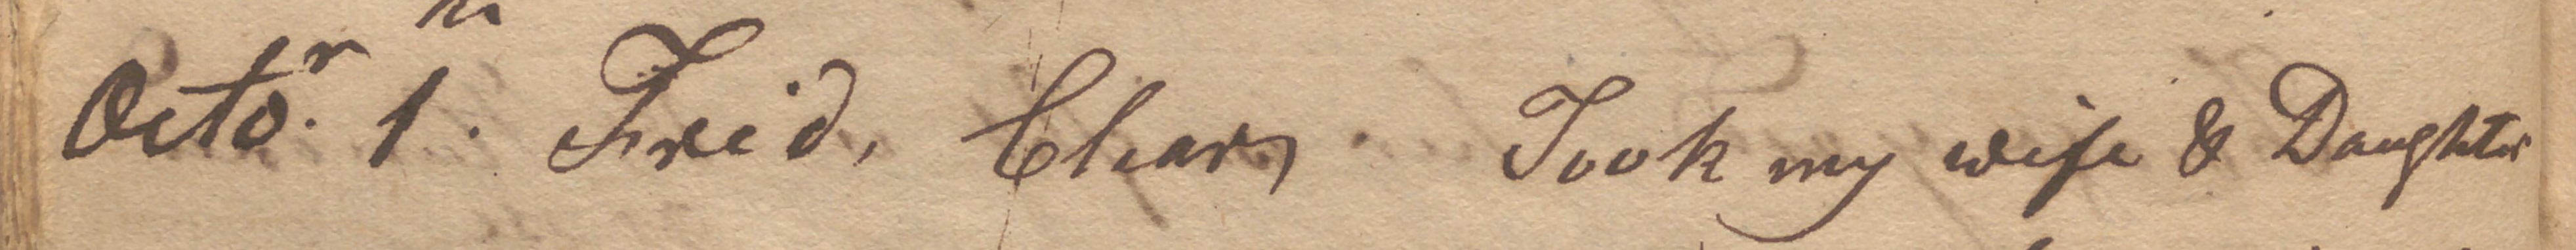Octo^r. 1^th. Frid. Clear Took my wife & Daughter
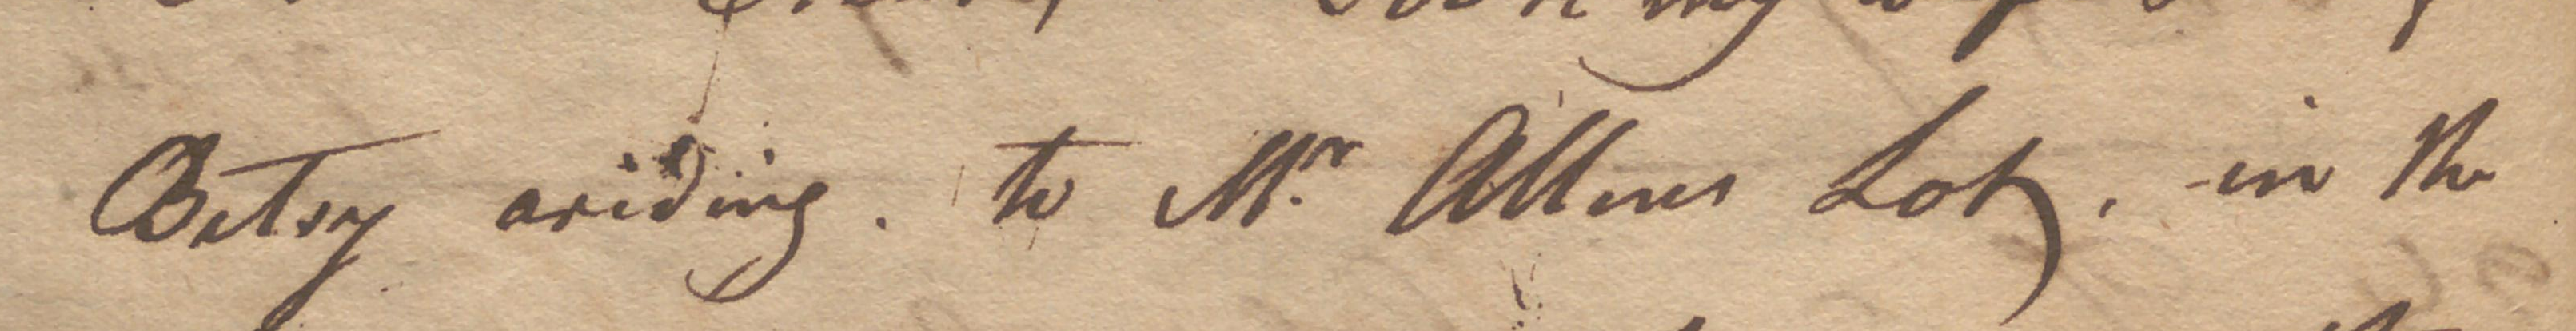Betsy ariding. to M^r. Allens Lot. in the
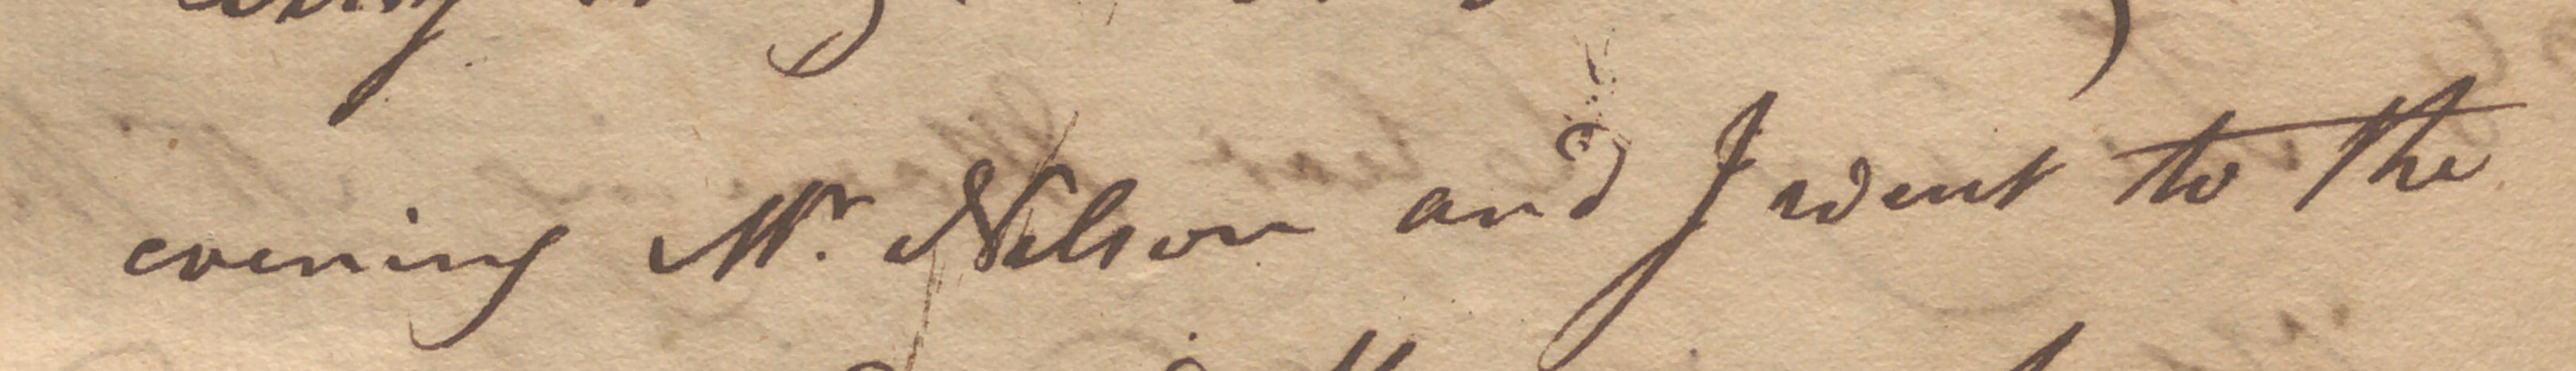evering M^r. Nelson and I went to the
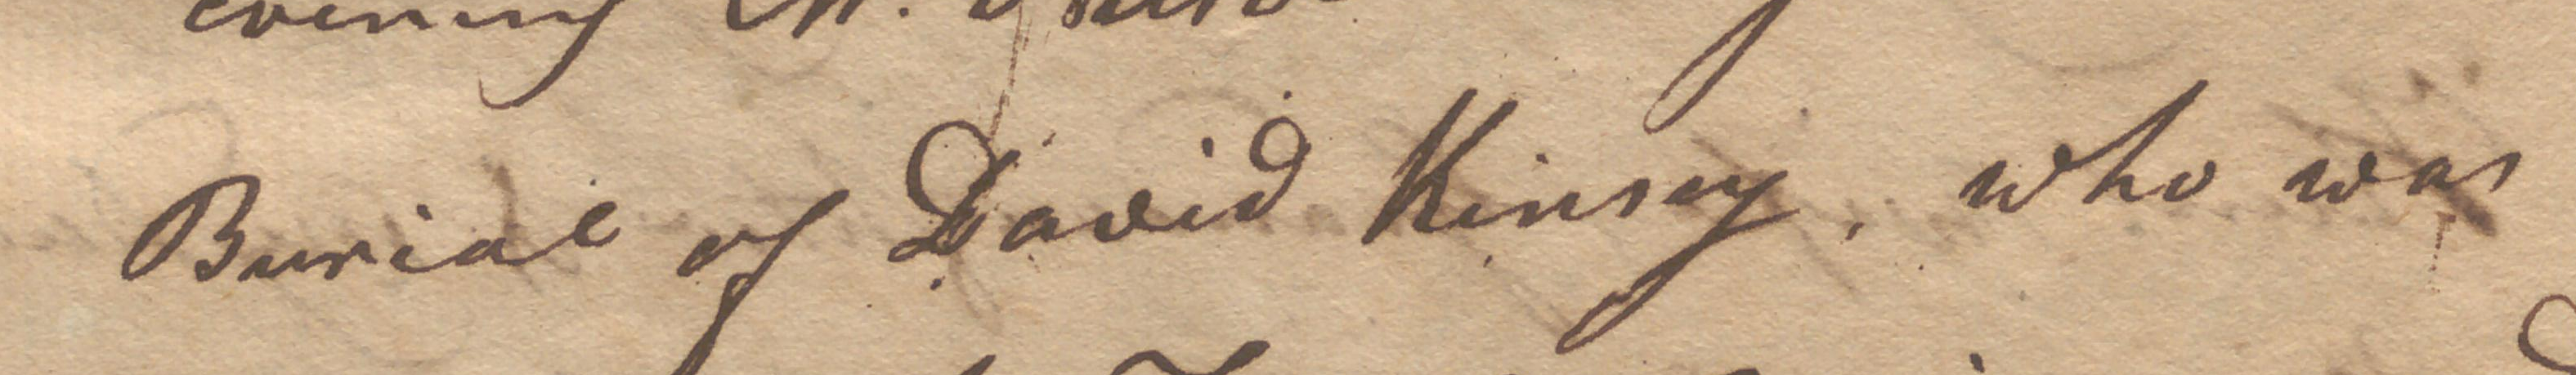Burial of David Kinsey, who was
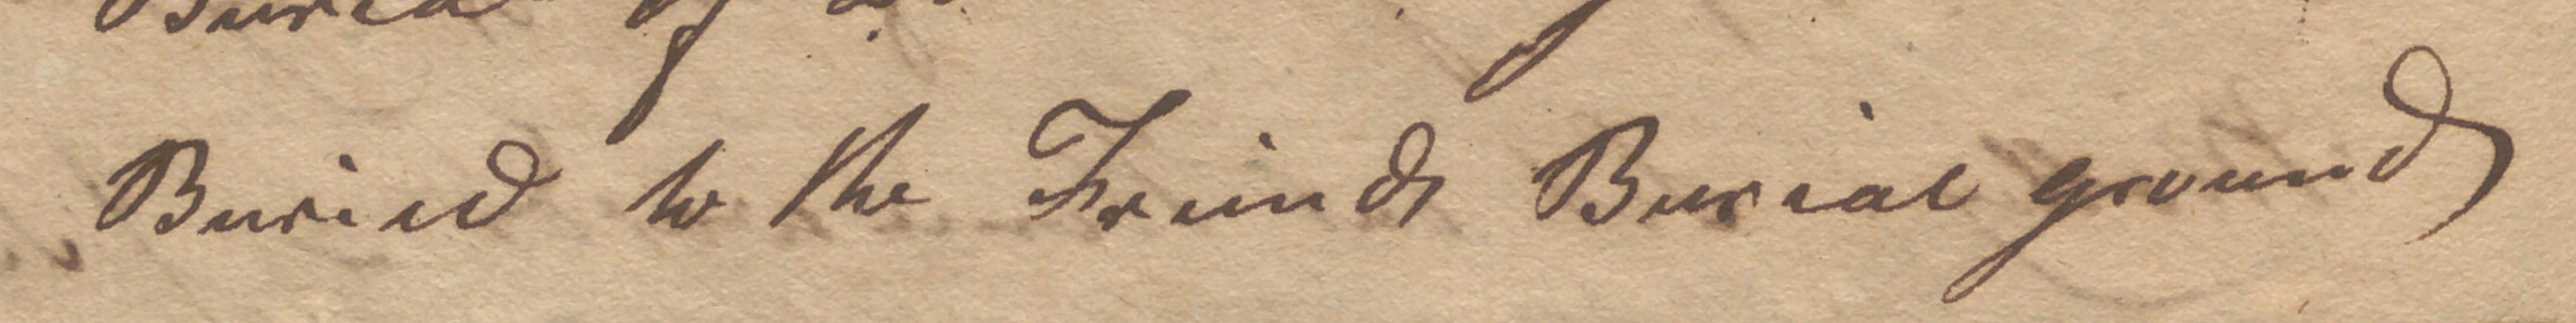Buried to the Friends Burial ground
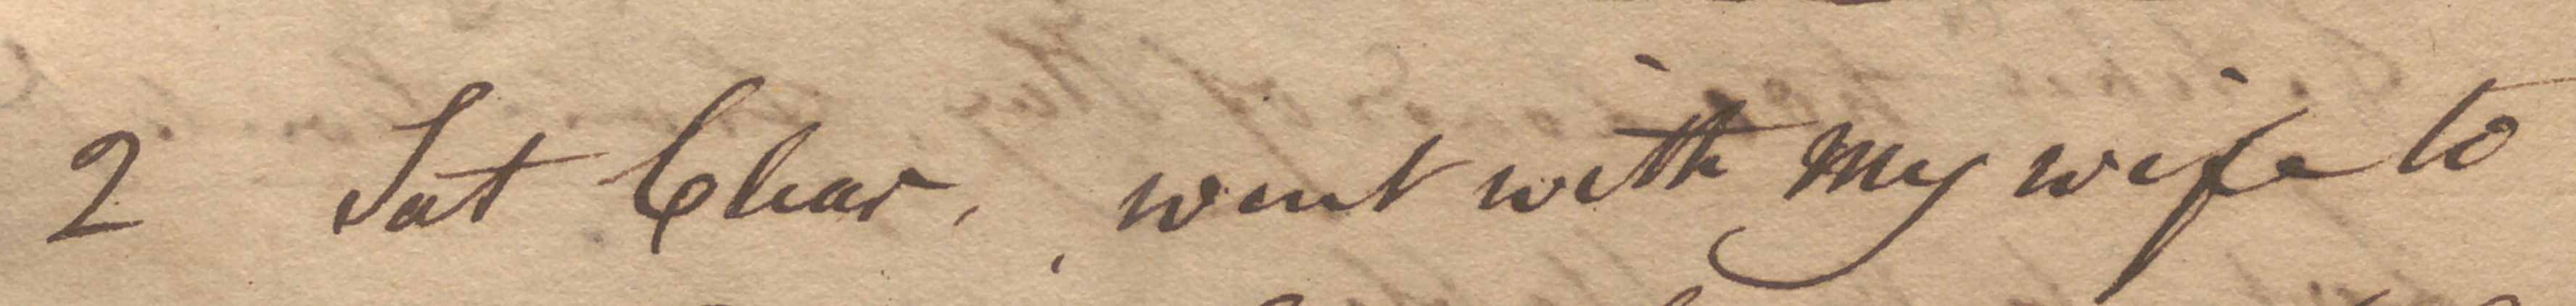2 Sat Clear, went with my wife to
